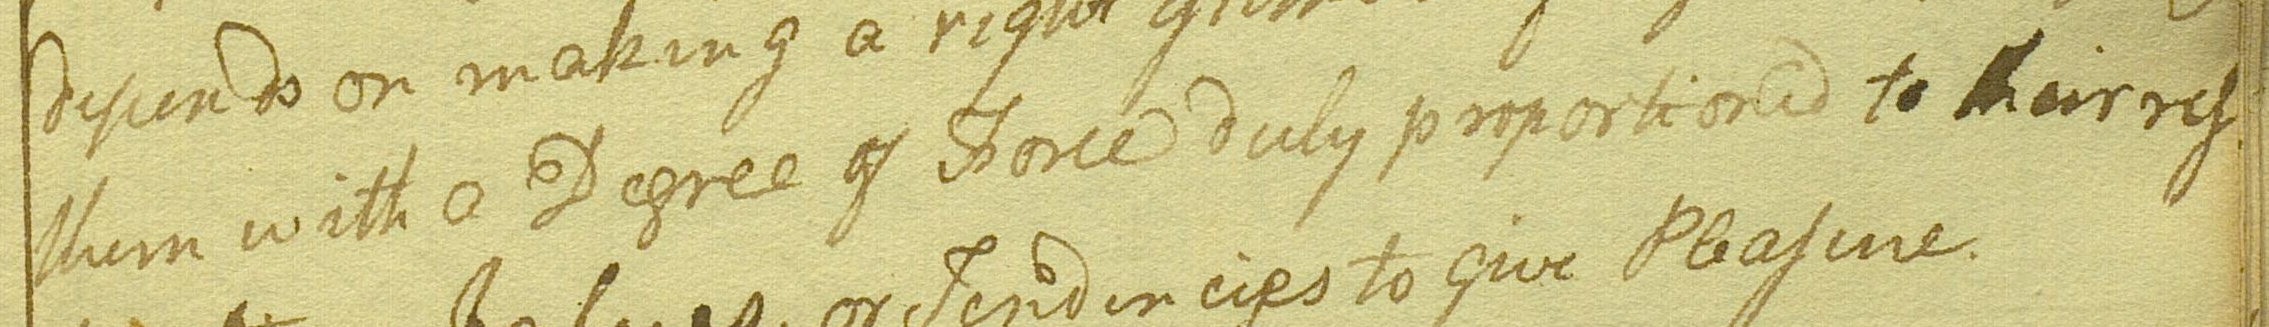them with a Degree of Force duly proportioned to their res
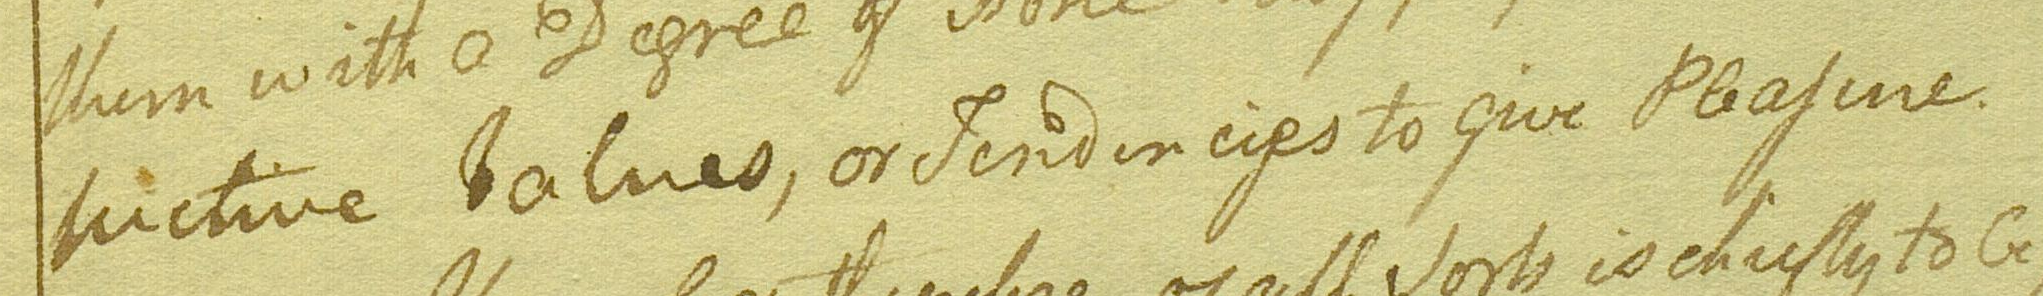pective values, or Tendencies to give Pleasure.
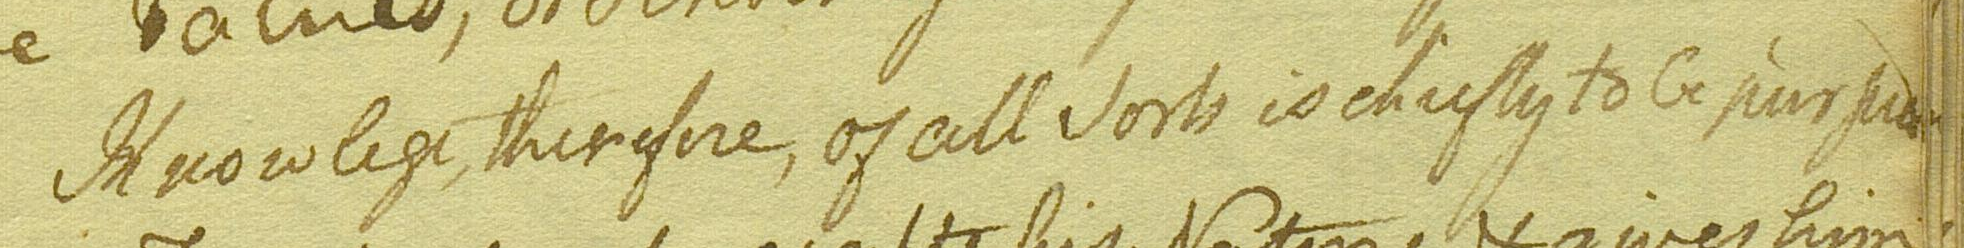Knowledge, therefore, of all sorts is chiefly to be pursued
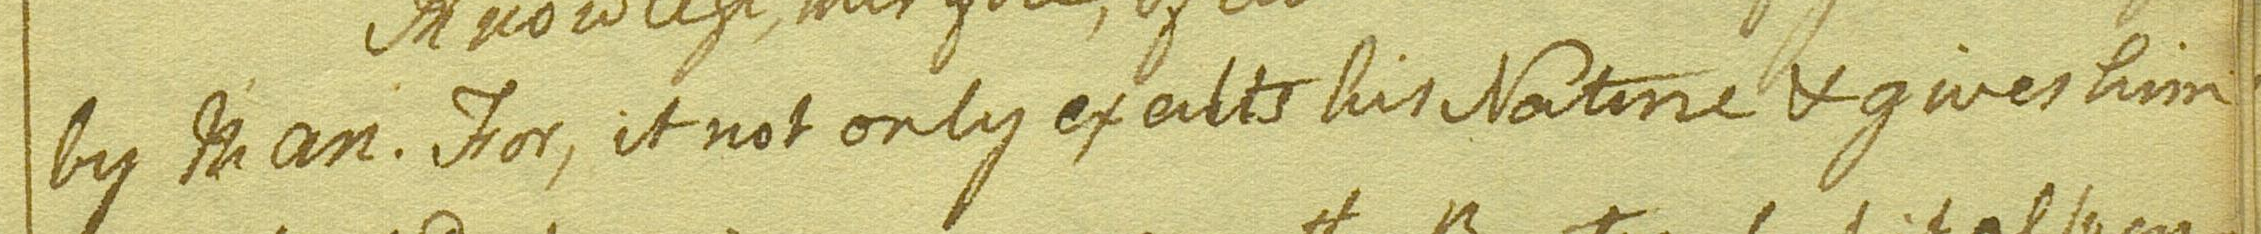by Man. For, it not only exalts his Nature & gives him
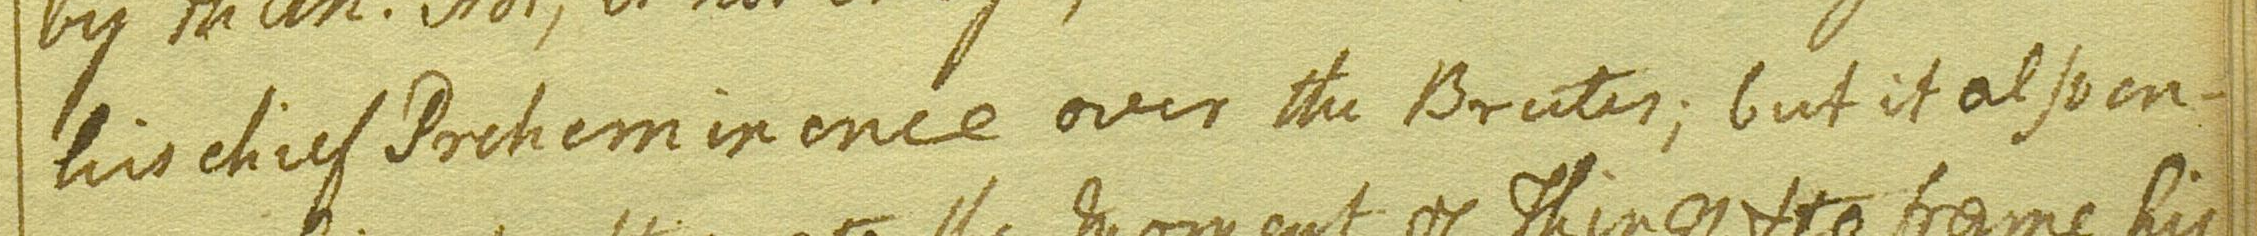his chief Preheminence over the Brutes; but it also en-
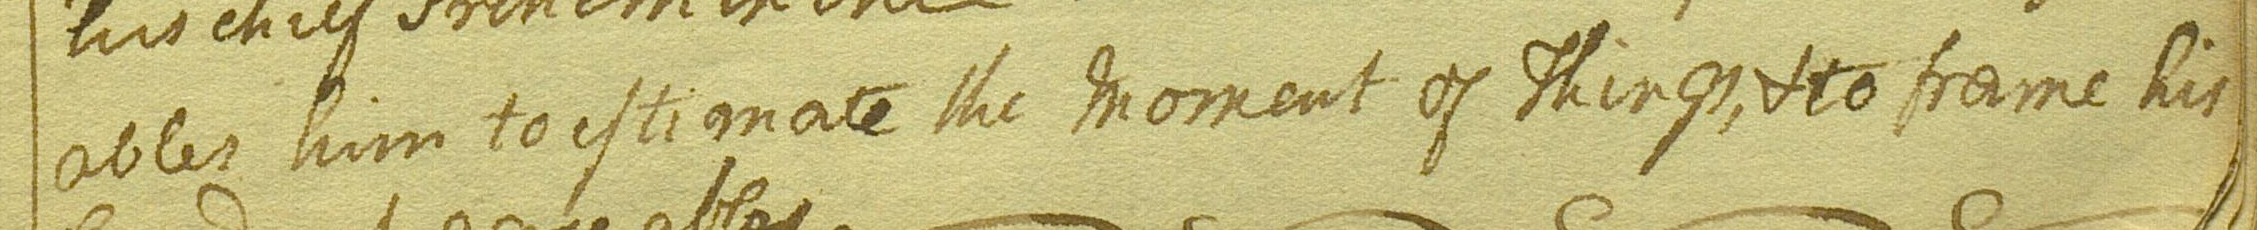ables him to estimate the moment of things, & to frame his
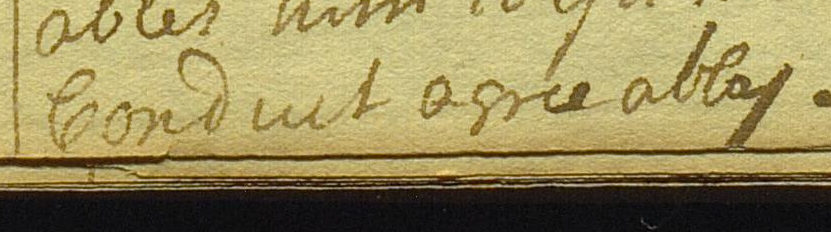conduct agreeably
